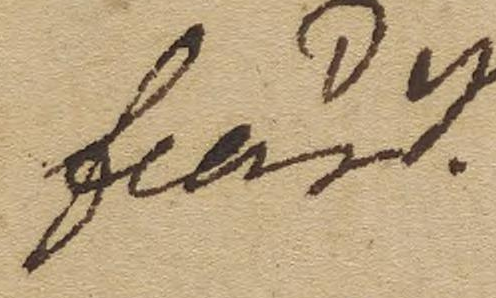fear.
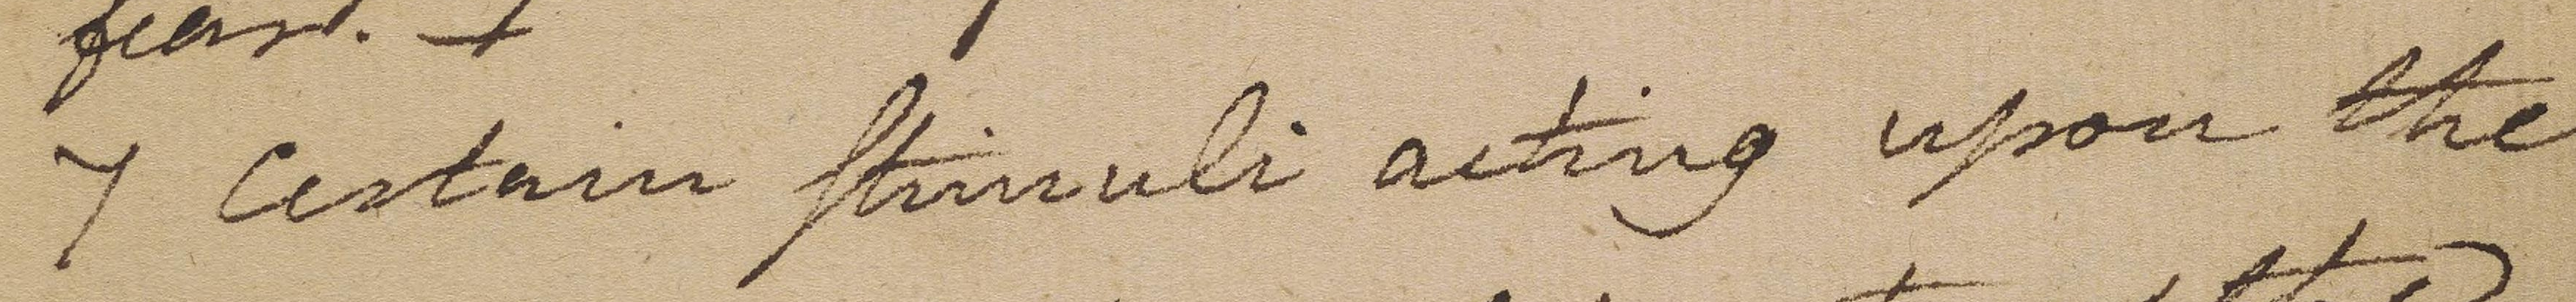7 Certain Stimuli acting upon the
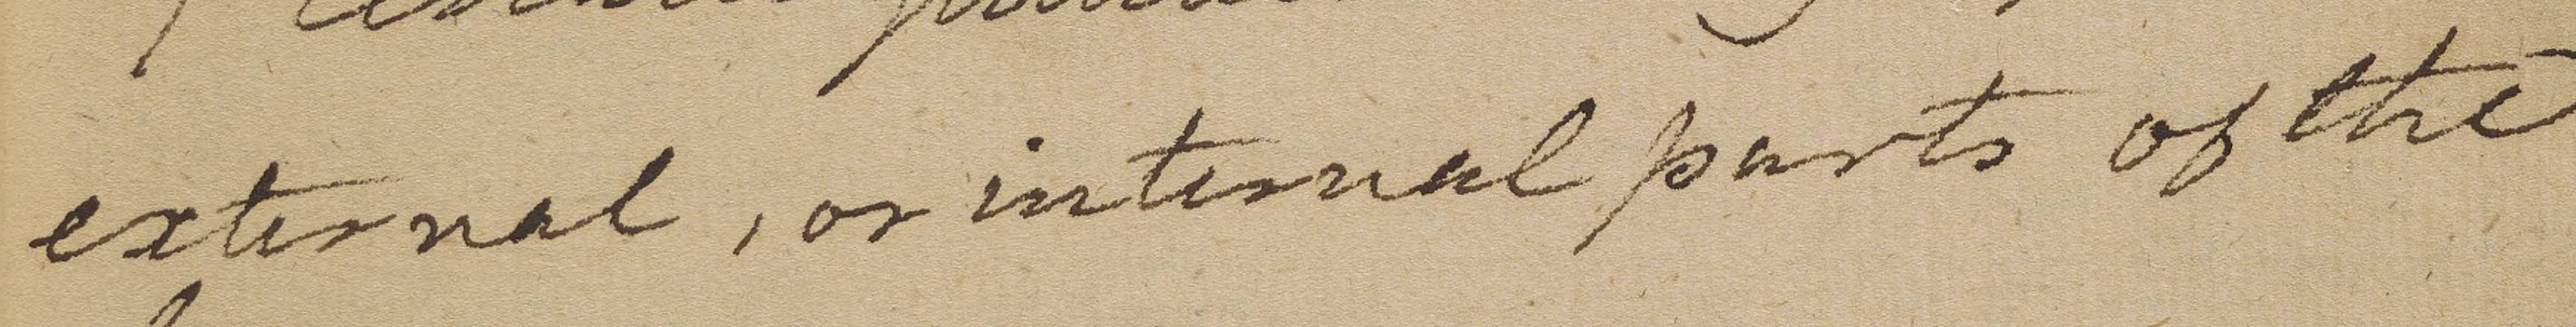external, or internal parts of the
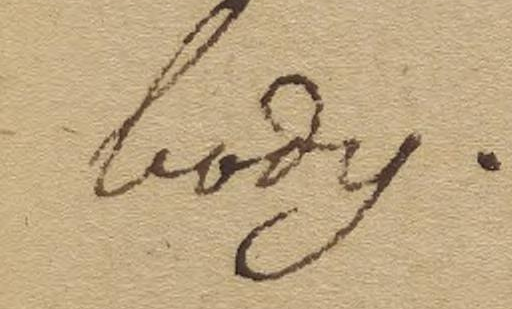body.
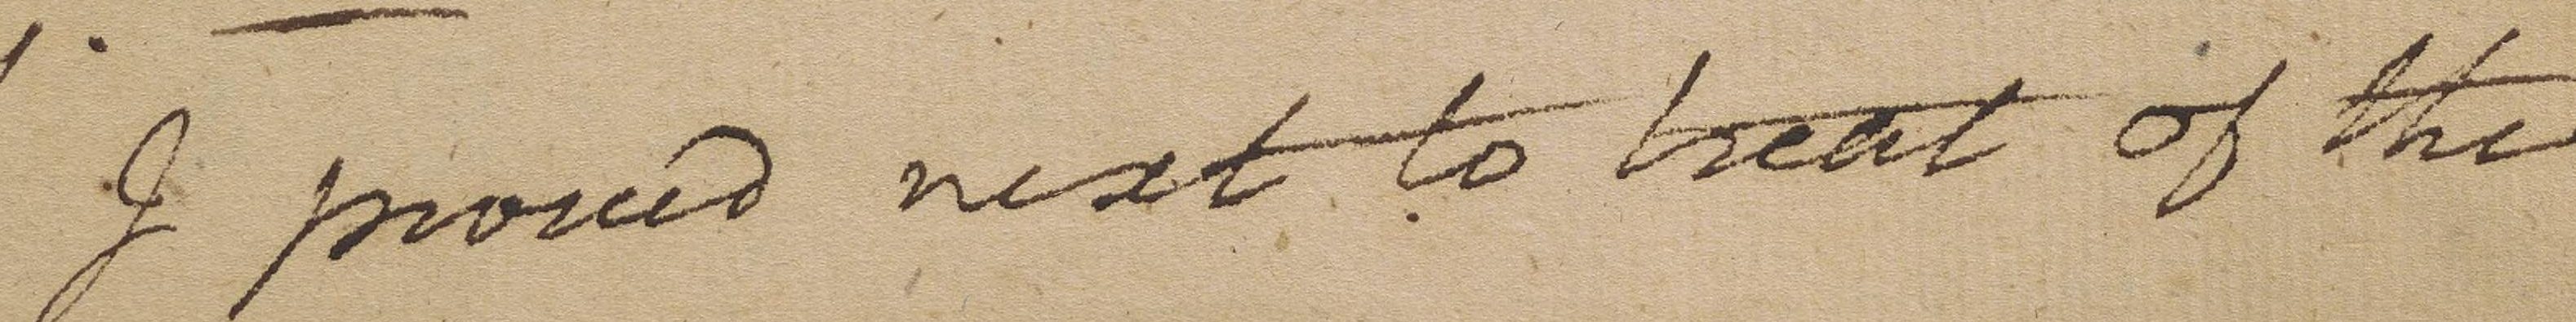I proceed next to treat of the
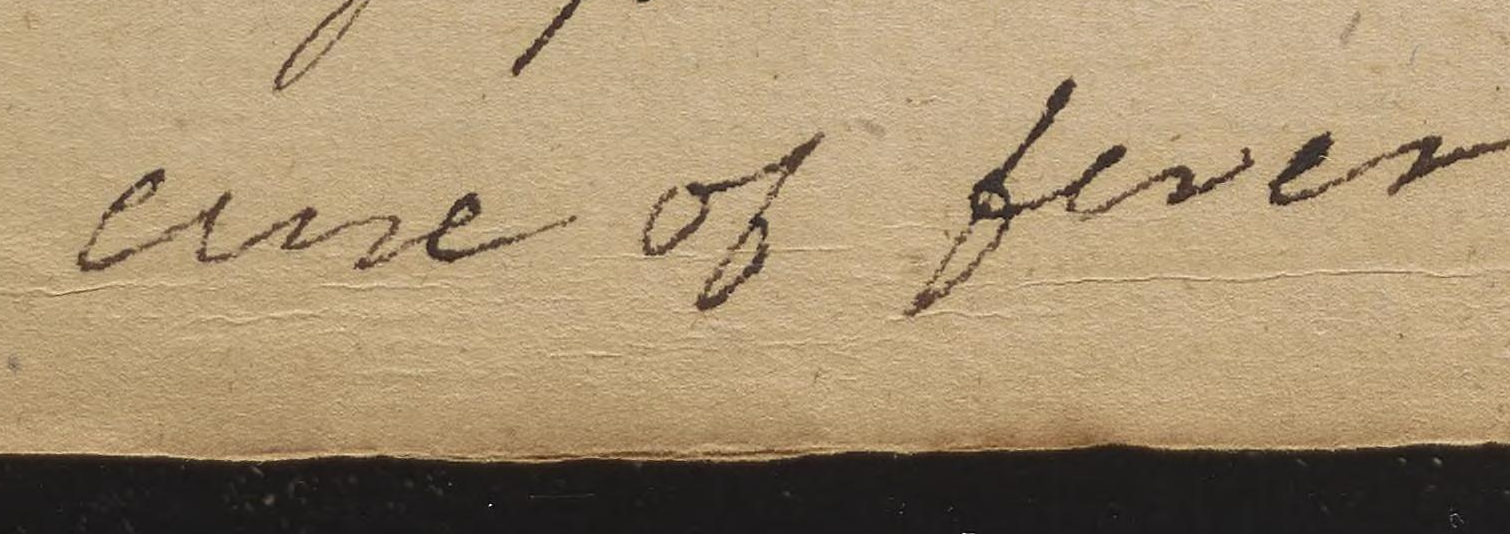cure of fever.
